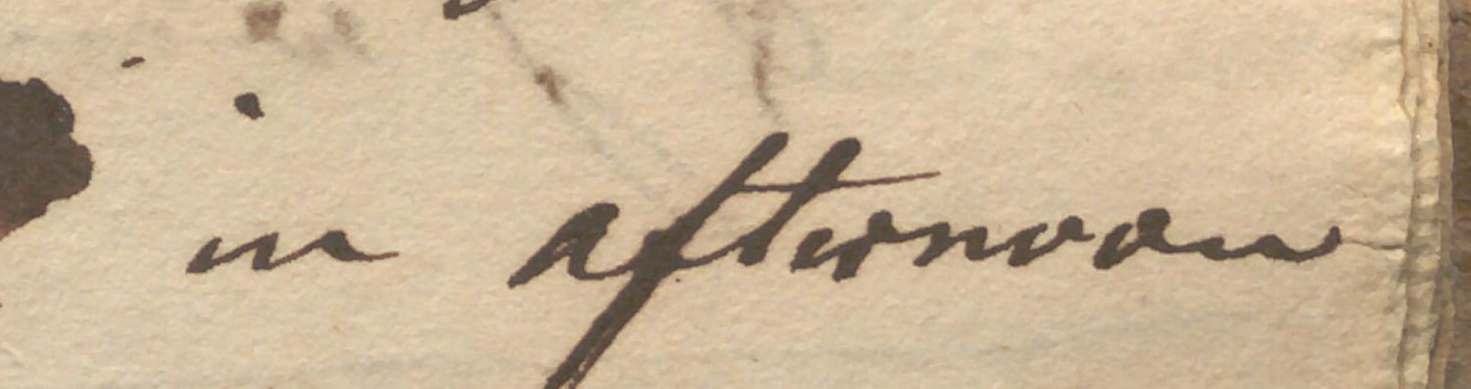in afternoon
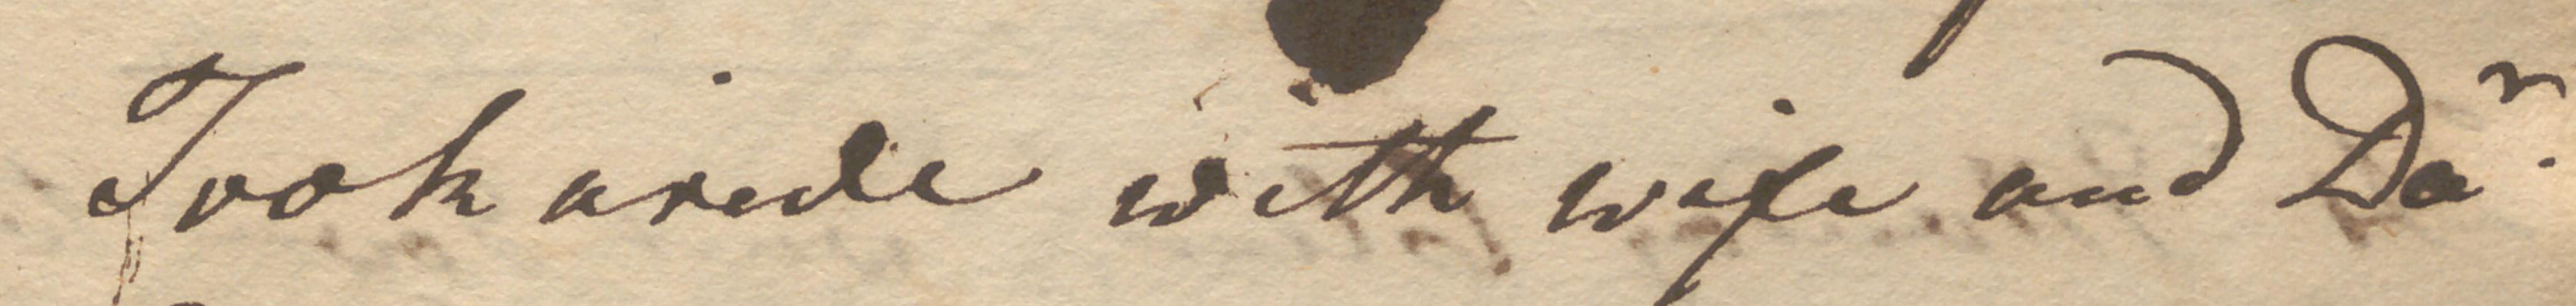Took a ride with wife and Da^r.
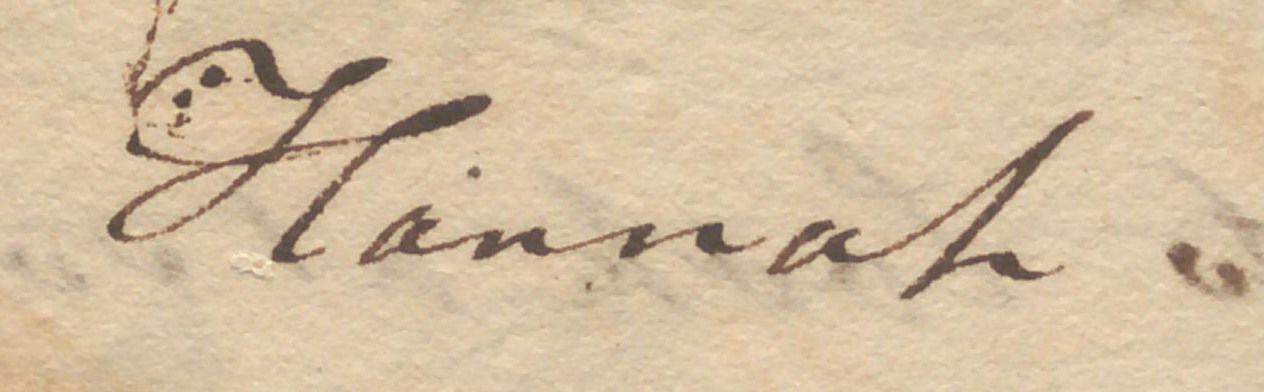Hannah
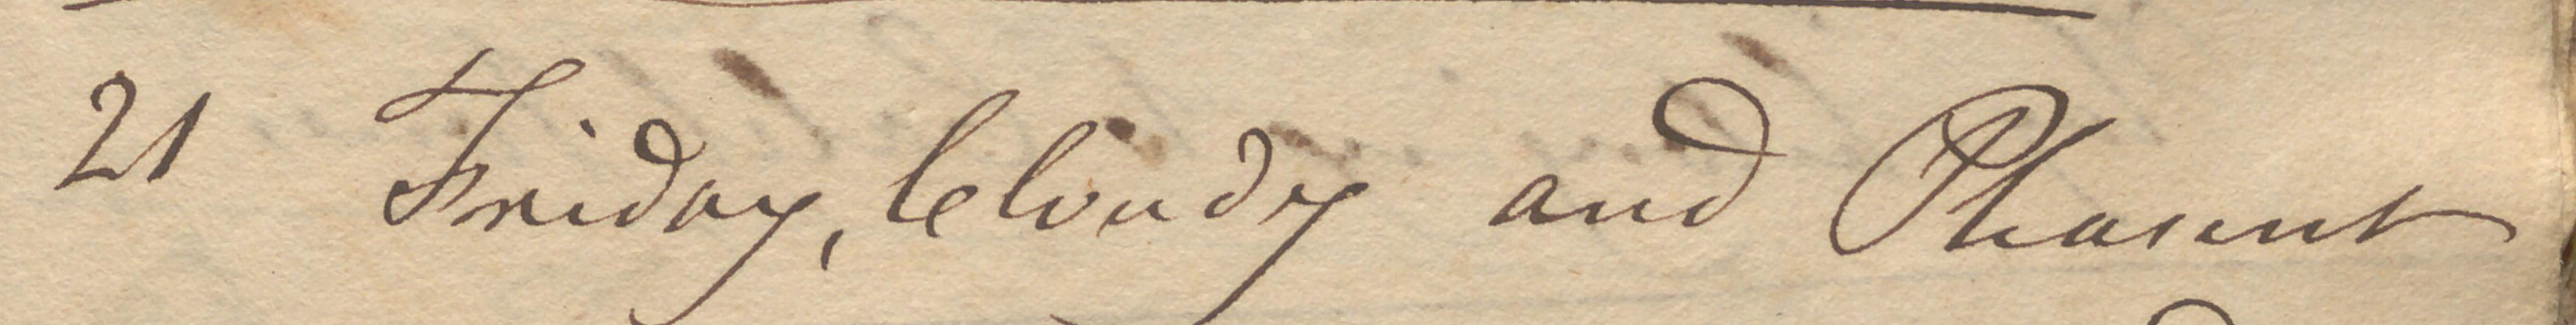21 Friday Cloudy and Pleasent
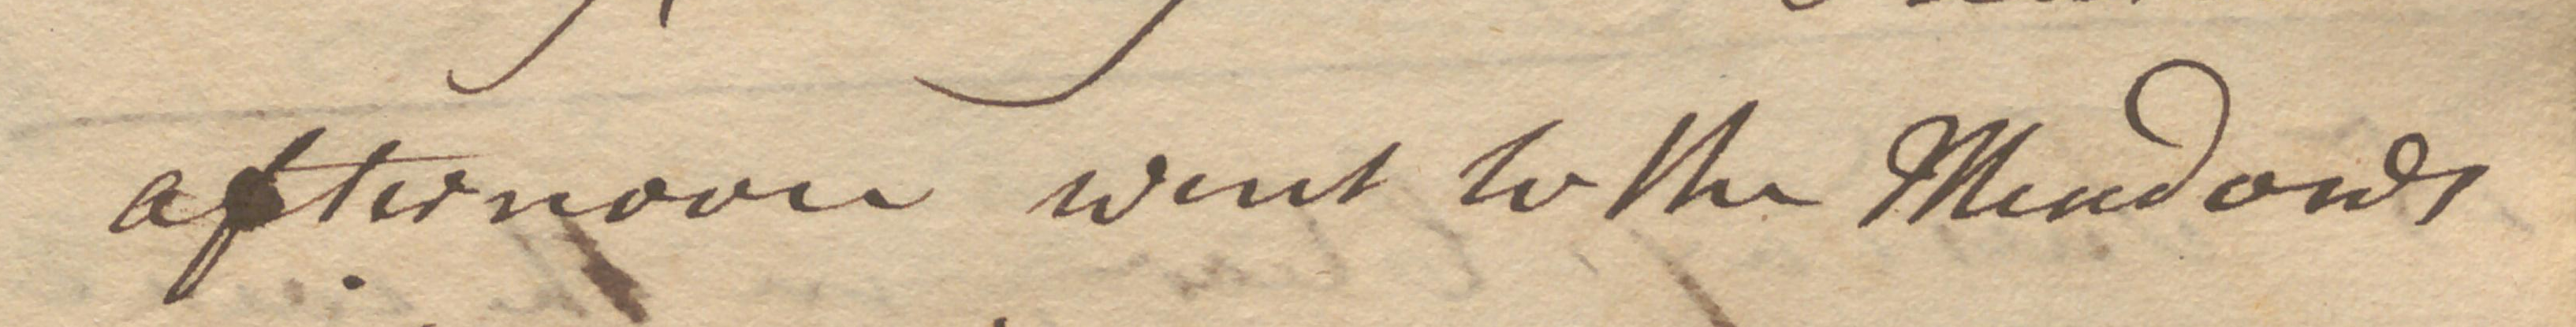afternoon went to the Meadows
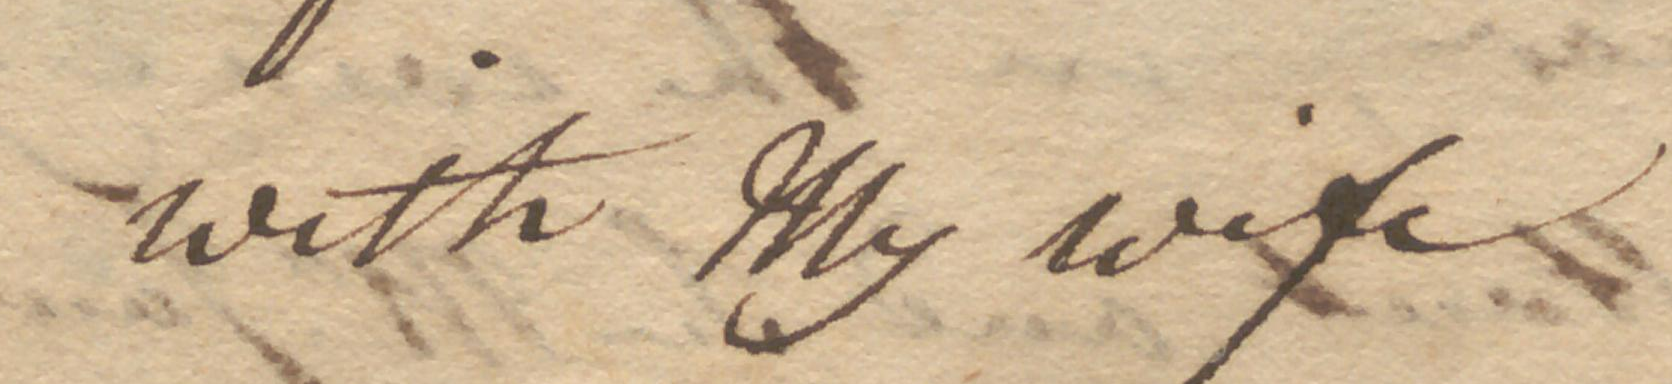with My wife
